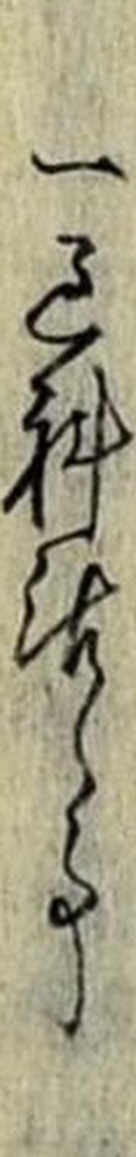一過料銀之事
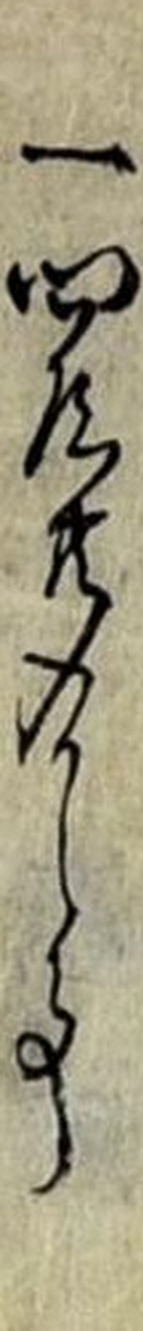一問屋共〆り之事
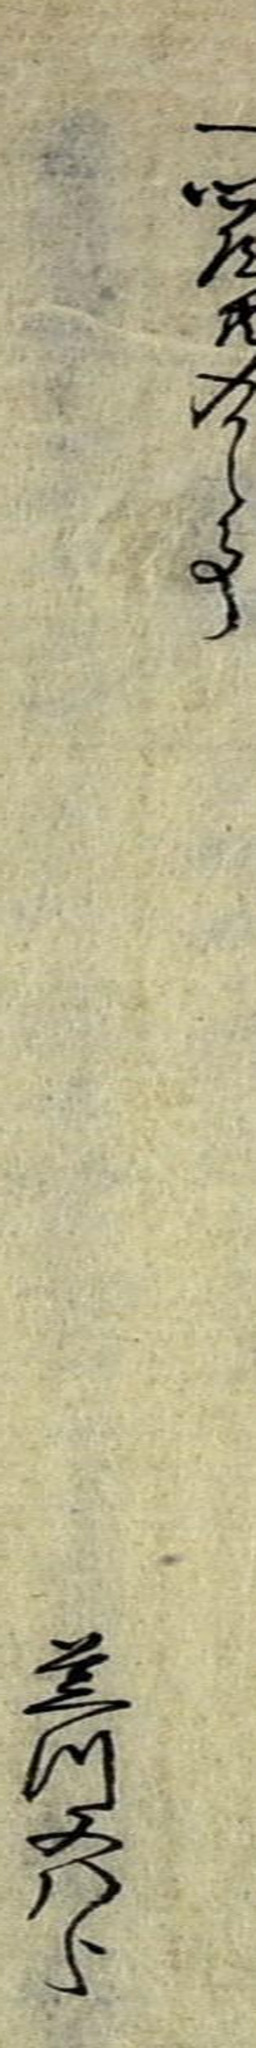荒川又八郎
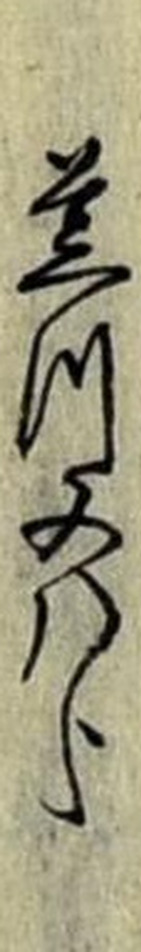荒川又八郎
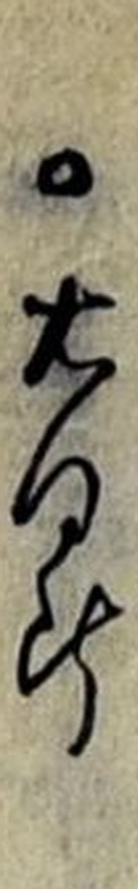〇右同断
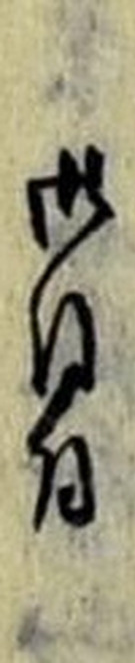御目付
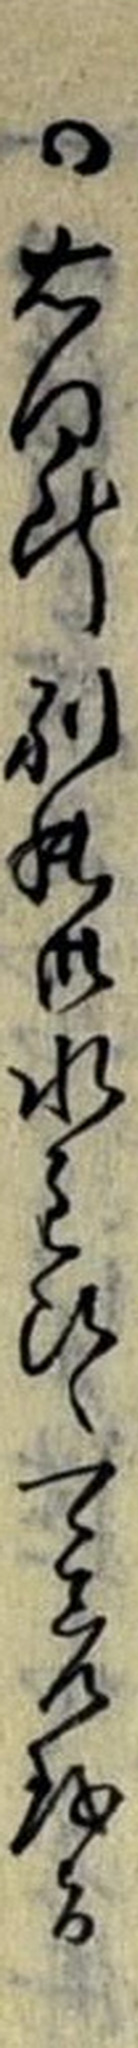〇右同断別紙御水主頭へ可差越旨
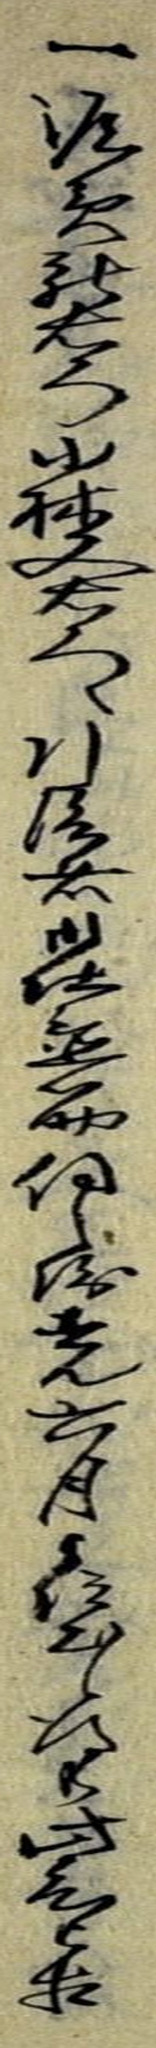一渥美新右衛門小林又右衛門へ引渡者御仕置筋伺之儀去ル六月被仰出候得共此度被相
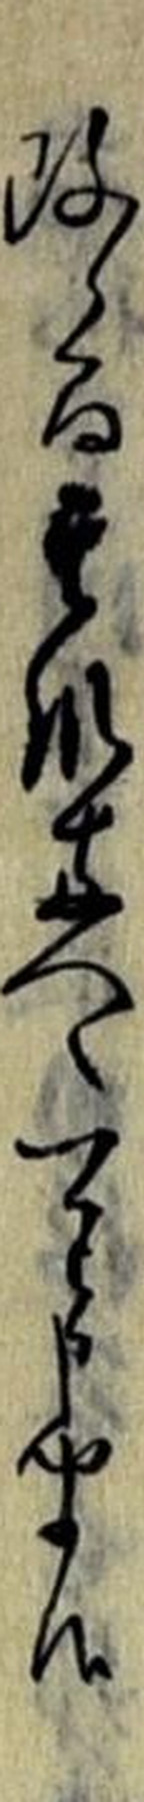改候間其段両人へ可被申聞候
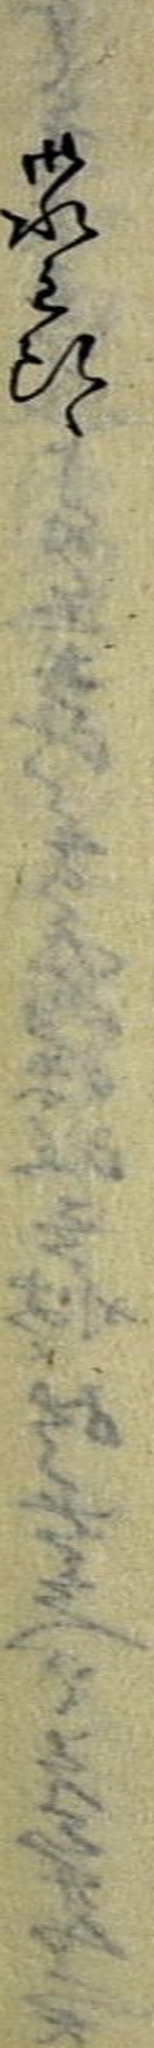御水主頭へ
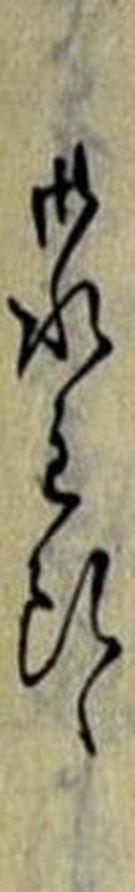御水主頭へ
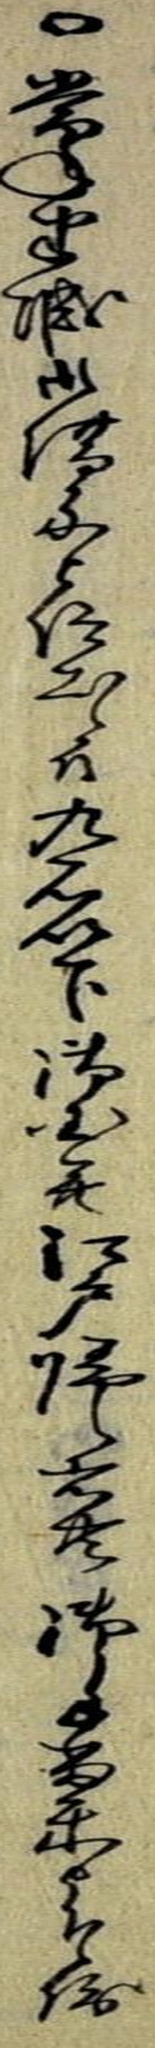〇当年半減御借米被仰出候ニ付九石以下御国并江戸帰之者共御手当米被下候儀
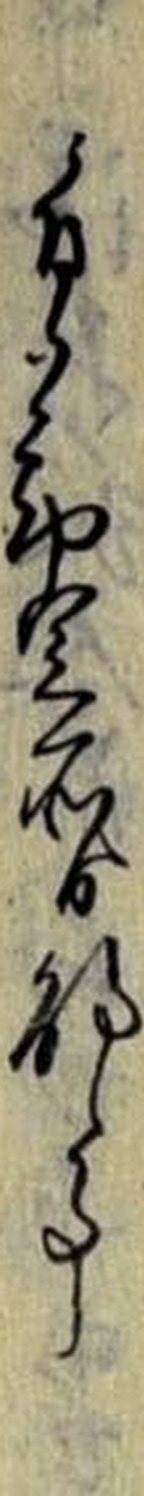ニ付御勘定所ゟ触候事
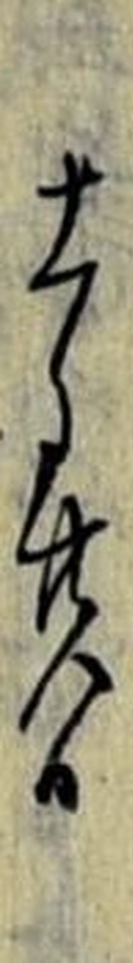十一月廿八日
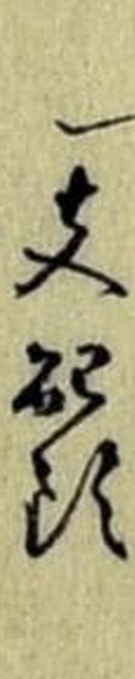支配頭
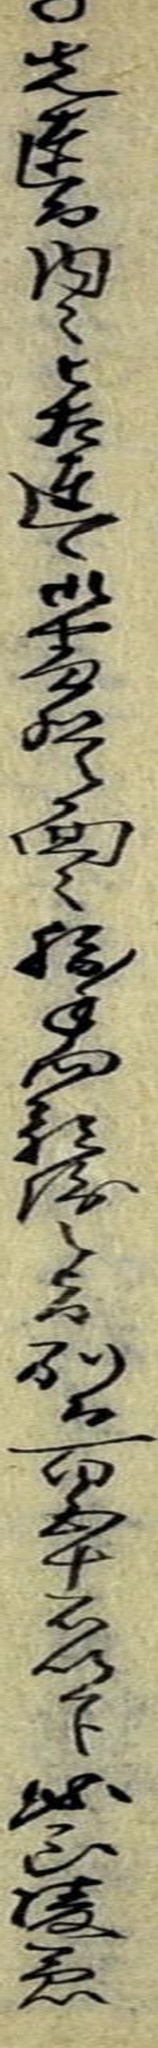〇先達而内々被相達候御番組之面々勝手向難儀之旨別而百五十石以下必至凌兼
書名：命令之部 三
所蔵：福井県文書館 Fukui Prefectural Archives
